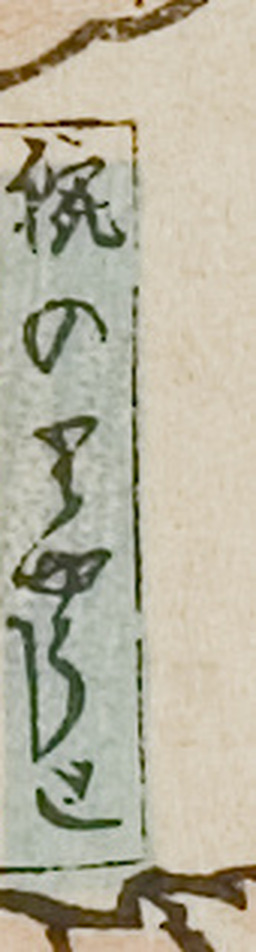腕のりやうじ
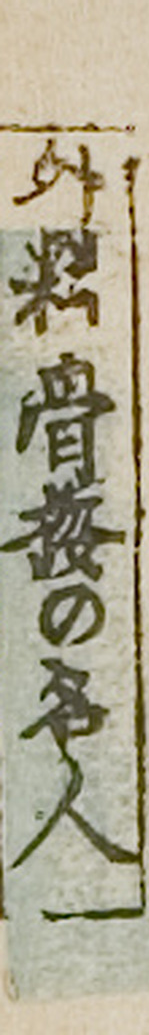外料骨接の名人
